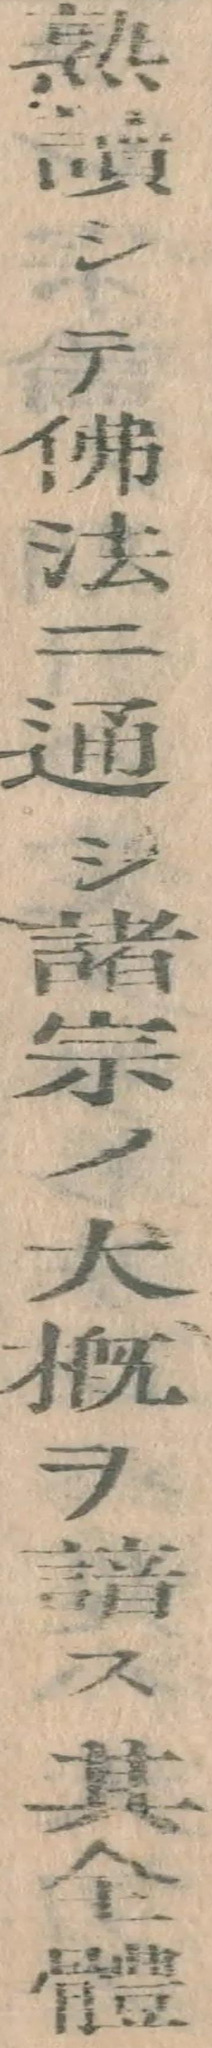熟読シテ仏法ニ通シ諸宗ノ大概ヲ諳ス其全体
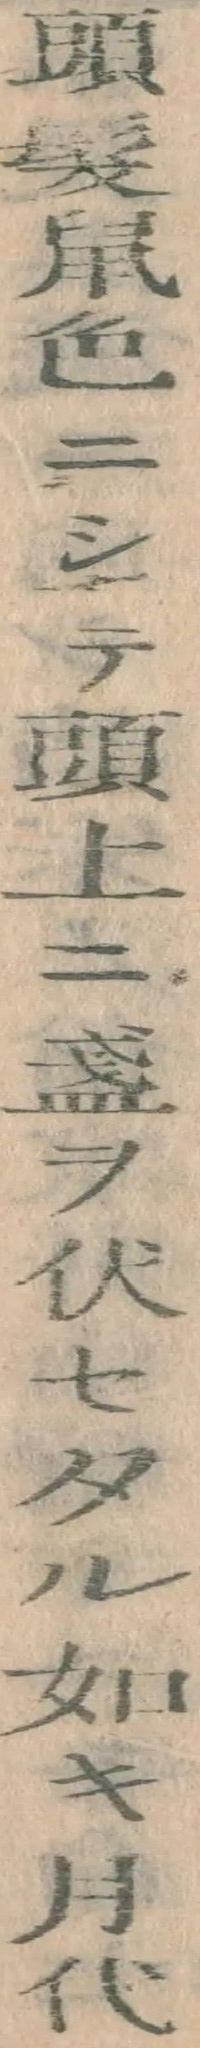頭髪鼠色ニシテ頭上ニ盞ヲ伏セタル如キ月代
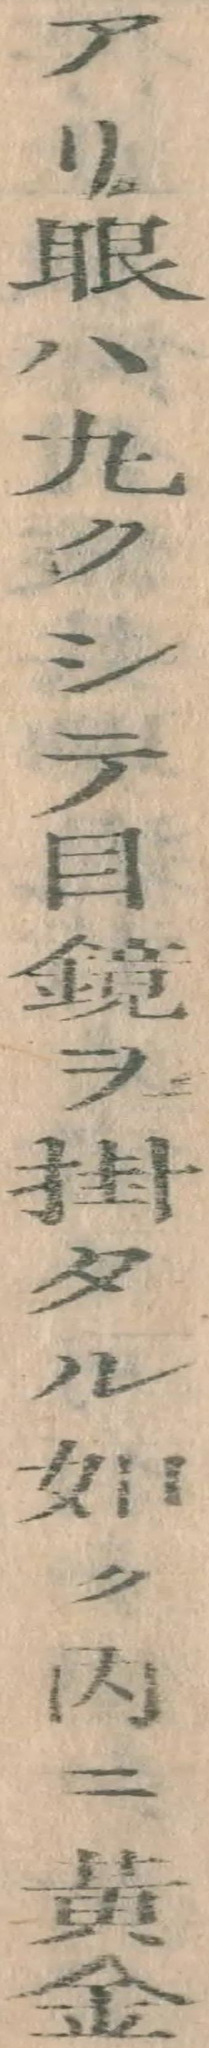アリ眼ハ丸クシテ目鏡ヲ掛タル如ク内ニ黄金
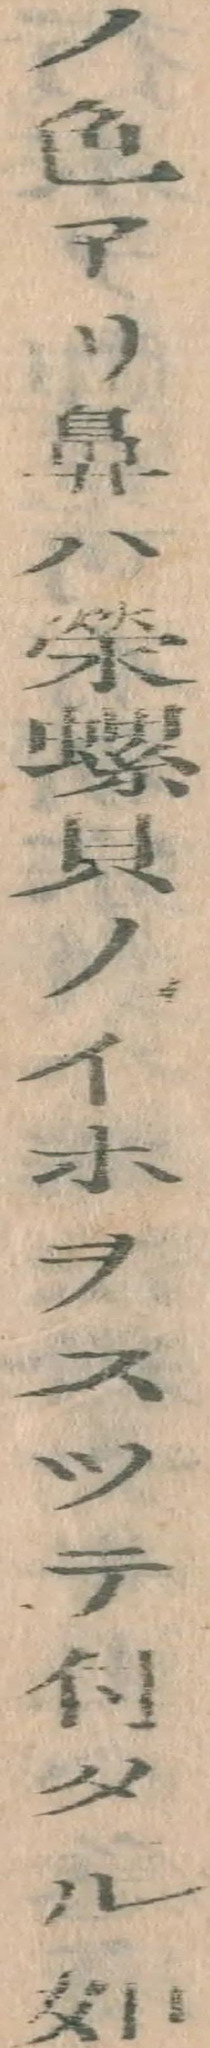ノ色アリ鼻ハ栄螺貝ノイホヲスツテ付タル如
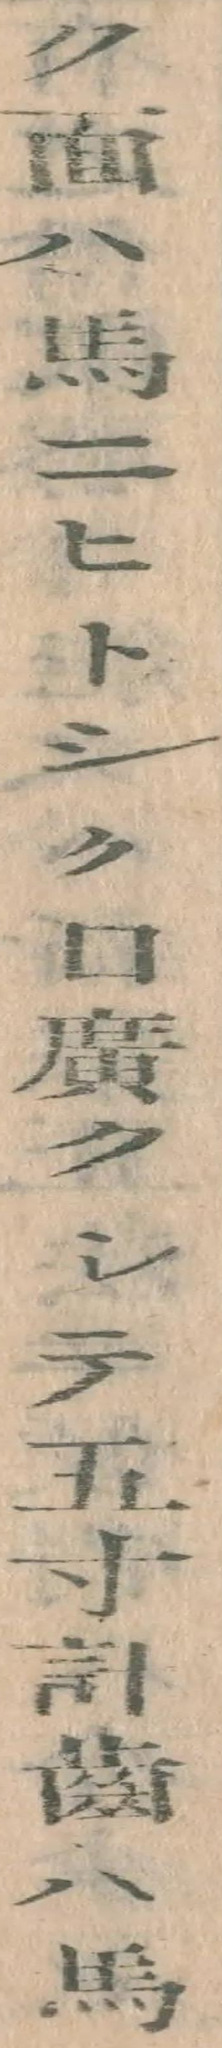ク面ハ馬ニヒトシク口広クシテ五寸計歯ハ馬
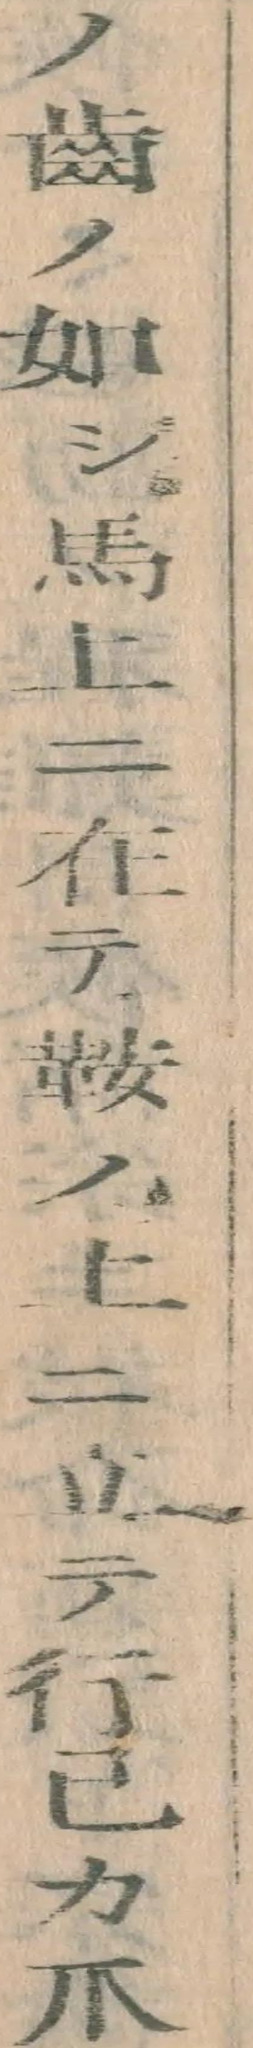ノ歯ノ如シ馬上ニ在テ鞍ノ上ニ立テ行已カ爪
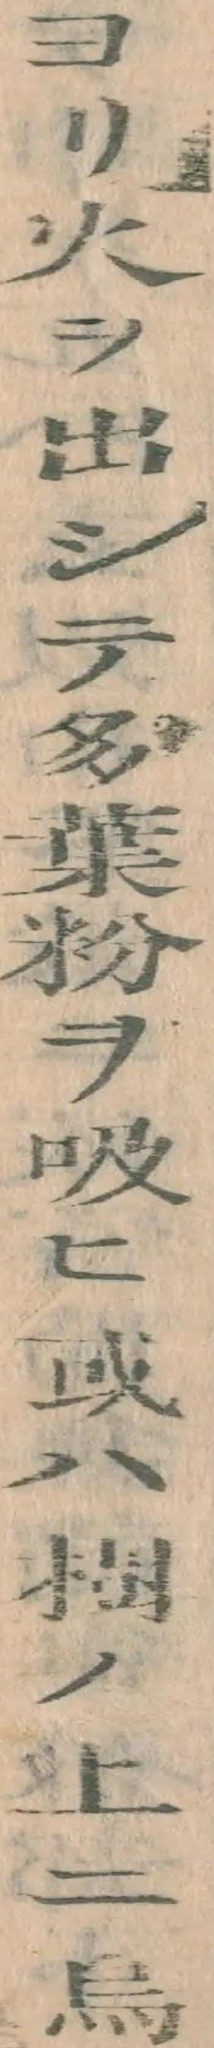ヨリ火ヲ出シテ多葉粉ヲ吸ヒ或ハ樹ノ上ニ烏
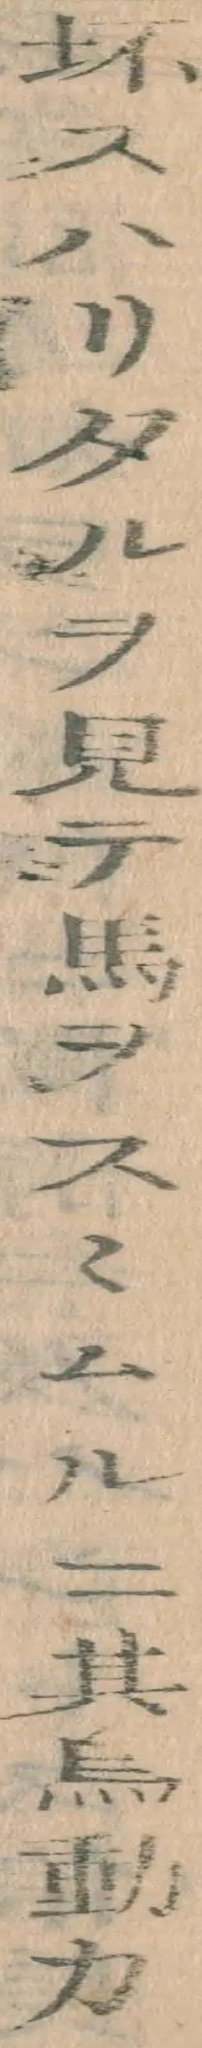坏スハリタルヲ見テ馬ヲス〱ムルニ其烏動カ
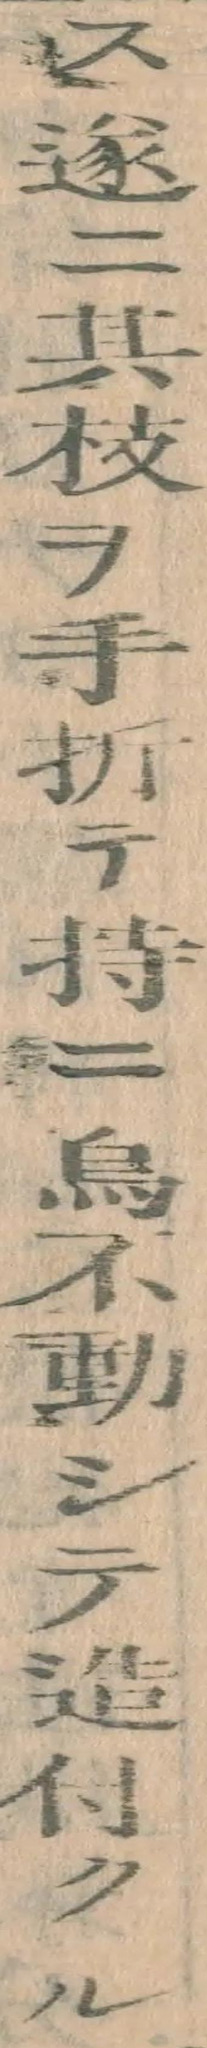ス遂ニ其枝ヲ手折テ持ニ烏不動シテ造付クル
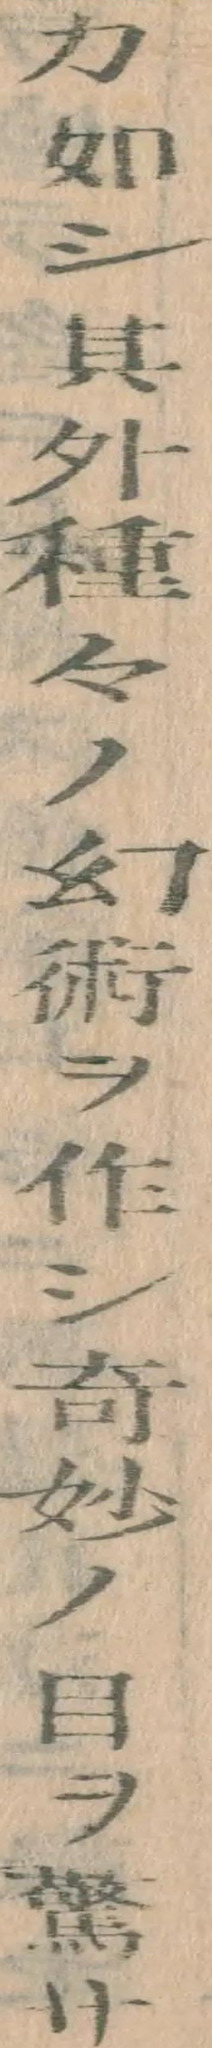カ如シ其外種々ノ幻術ヲ作シ奇妙ノ目ヲ驚サ
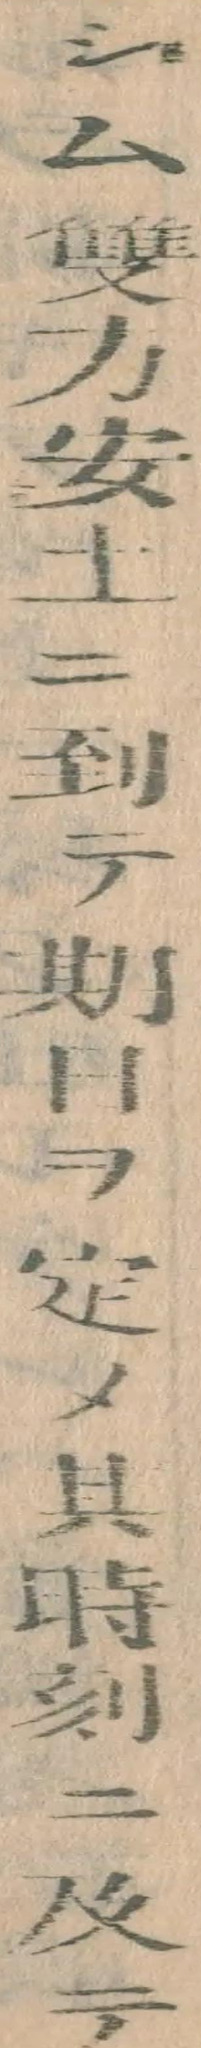シム双方安土ニ到テ期日ヲ定メ其時刻ニ及テ
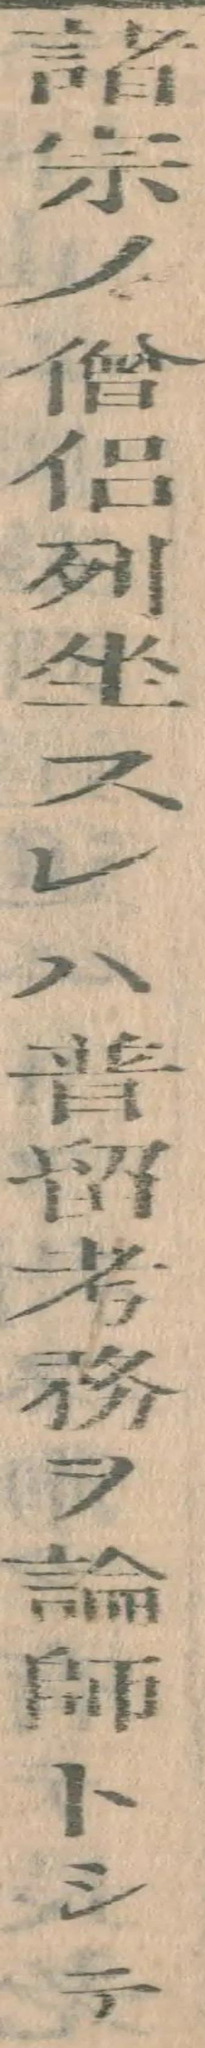諸宗ノ僧侶列坐スレハ普留考務ヲ論師トシテ
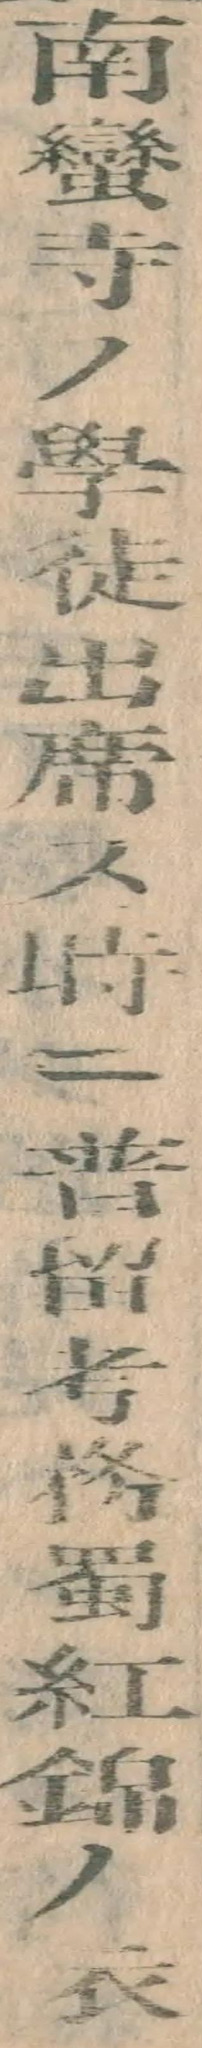南蛮寺ノ学徒出席ス時ニ普留考務蜀紅錦ノ衣
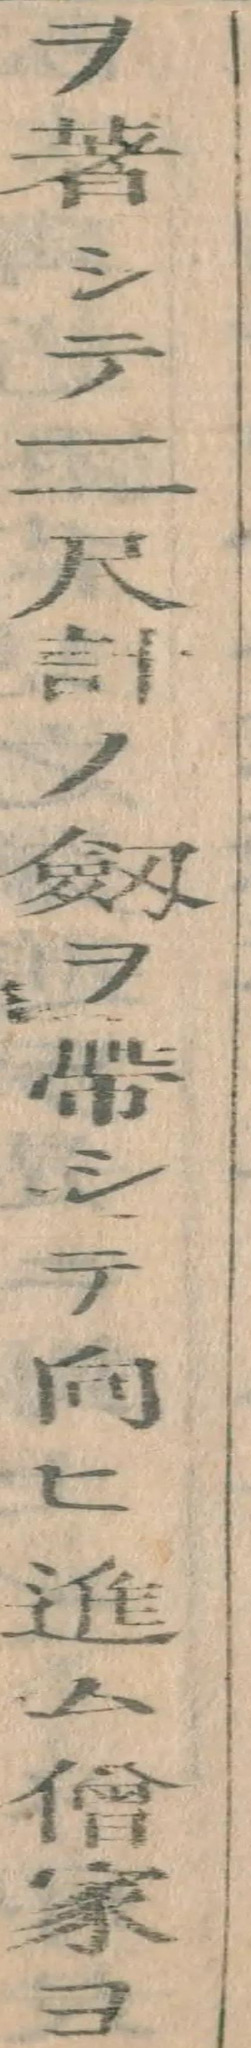ヲ著シテ二尺計ノ剣ヲ帯シテ向ヒ進ム僧家ヨ
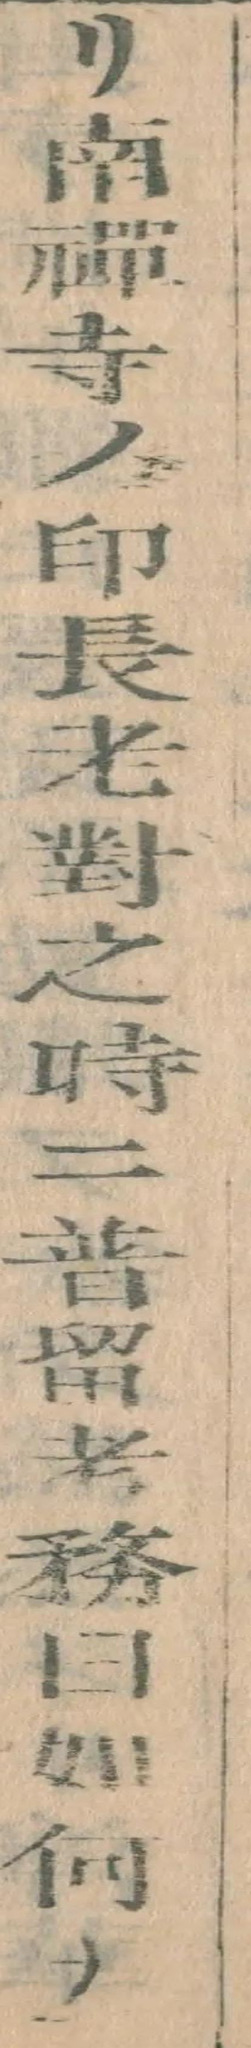リ南禅寺ノ印長老対之時ニ普留考務曰如何ナ
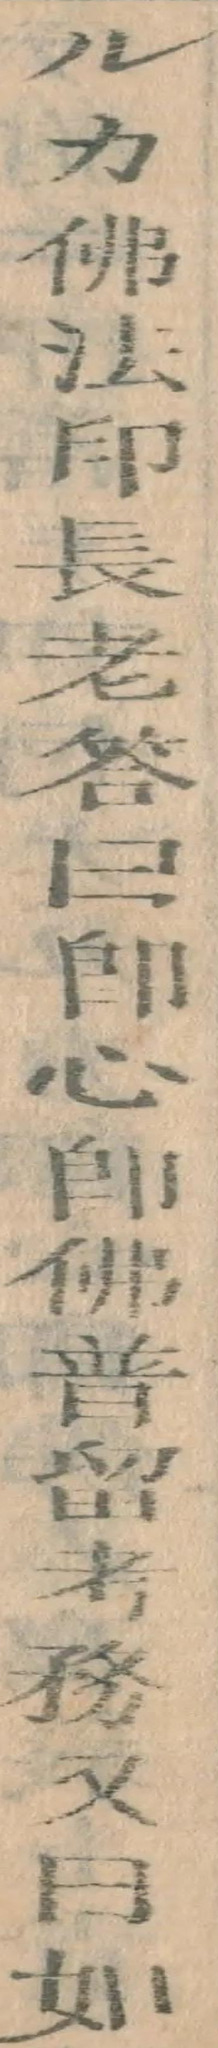ルカ仏法印長老答曰即心即仏普留考務又曰如
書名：南蛮寺興廃記
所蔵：国立国会図書館 National Diet Library, JAPAN
